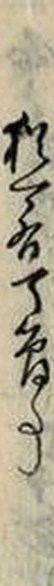猶可有了簡事
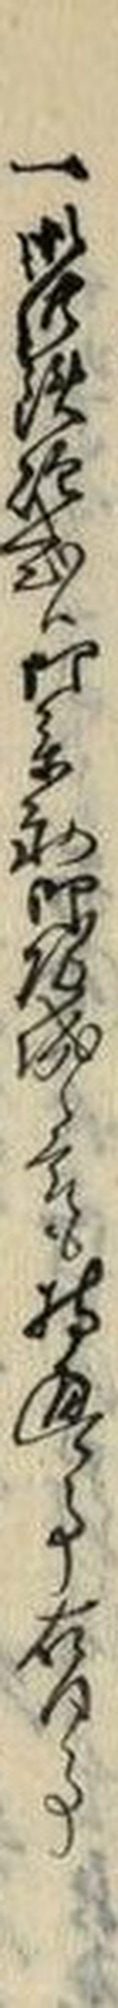一御供鉄砲或は御参勤御帰城之節も持通候事右同候事
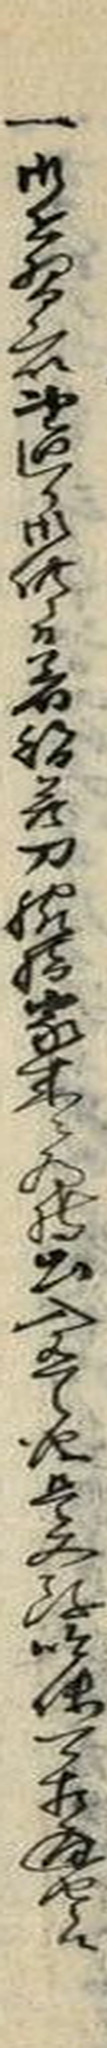一御近習衆野廻り御供に付着替并刀脇指家来に為持出入有之候儀是又致吟味可相通由ニ候
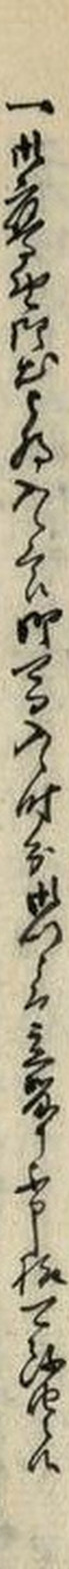一御鷹野御出被為入候節御馬入候時分御門に而立留り不申候様可致由に候
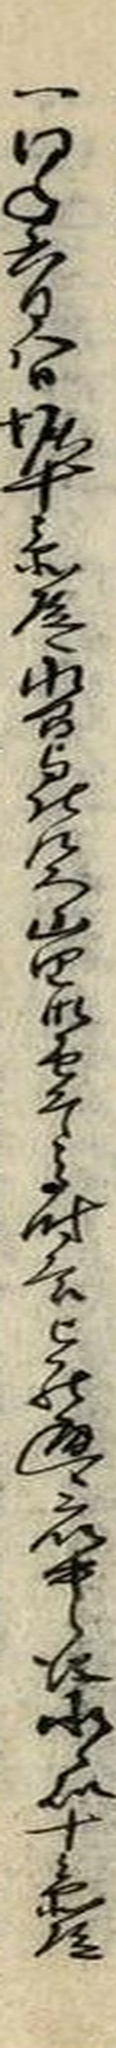一同年六月八日堀十兵衛殿へ水間与次右衛門山里御虫干之時節被罷通候衆中之儀承候処十兵衛殿
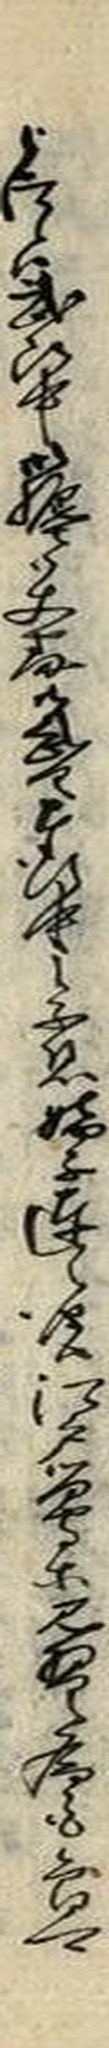被仰候は武頭中御城御使番御武具奉行中之子息嫡子達之儀は江戸留守等見習之為にも候間可
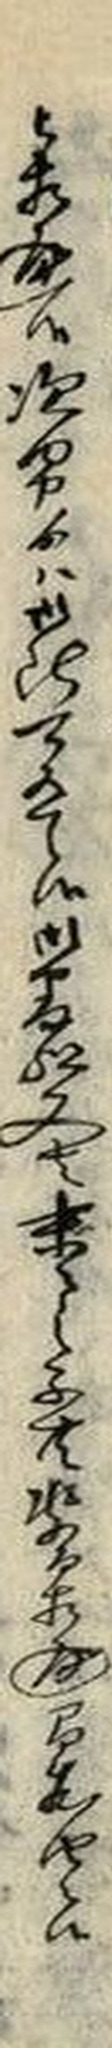被相通候次男ゟは御断可有之候御番組又は末々之子供決而相通間敷由に候
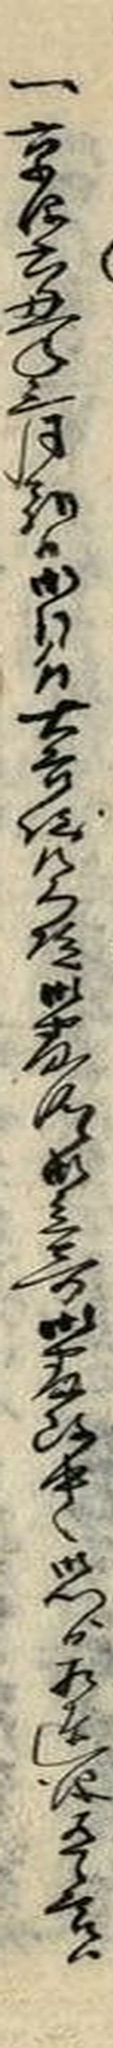一享保六丑年三月朔日御目付大谷儀左衛門殿御番所へ御立寄御番改中之御門ゟ相達儀有之節は
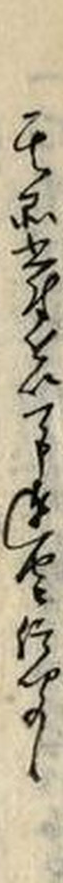其品書付を以可申達由被仰聞候
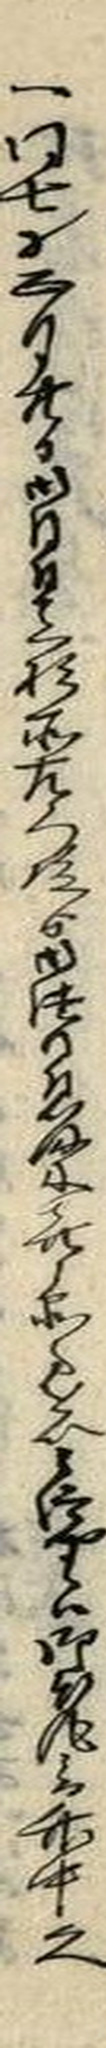一同七寅正月廿日御目付真杉所左衛門殿ゟ御徒目付簗喜兵衛方を以被仰聞候は御本丸に而竹中久
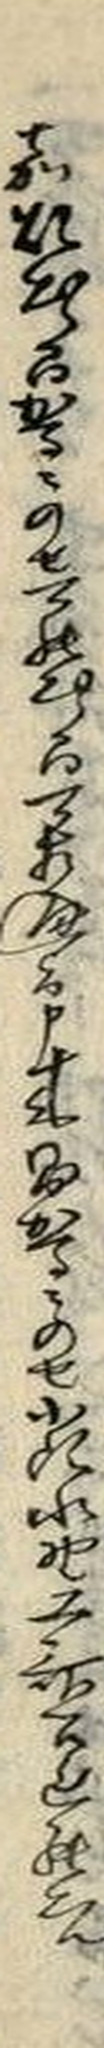嘉煩出候間駕にのせ可罷出候間可相通旨申来則駕にのせ小頭水野又斎召連罷出候
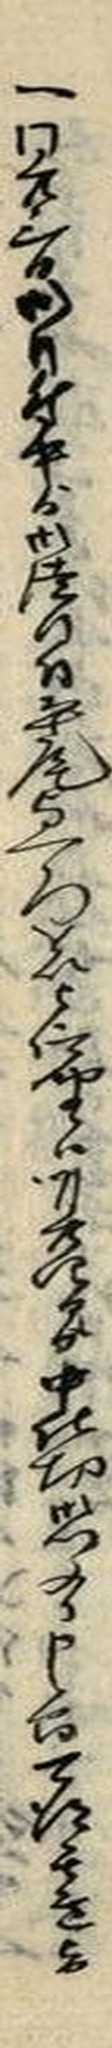一同廿三日御目付中ゟ御徒目付平尾与一右衛門を以被仰聞候は明廿四日ゟ中仕切御門〆り申候間可得其意旨
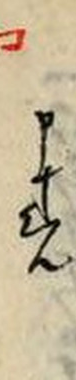申来候

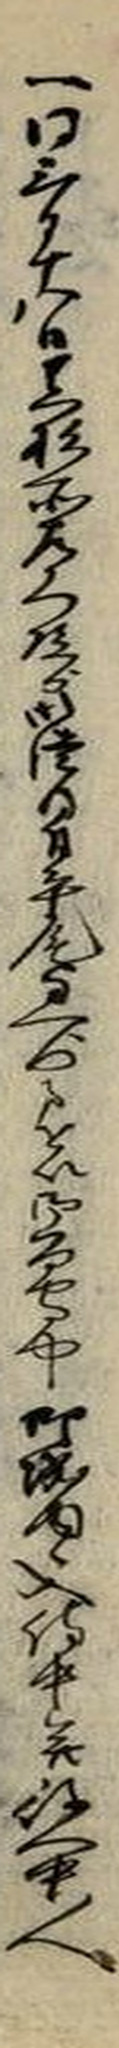一同三月十八日真杉所左衛門殿ゟ御徒目付平尾与一右衛門方を以御留守中御城内へ入侍中并役人中へ
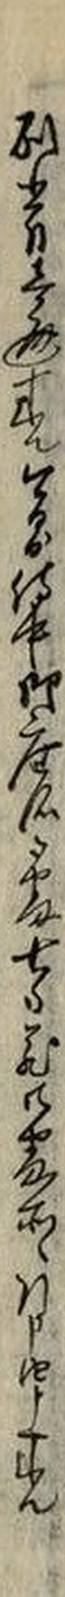別書付壱通来候今日ゟ侍中御座所御番七つ蔵御番所へ引申由申来候
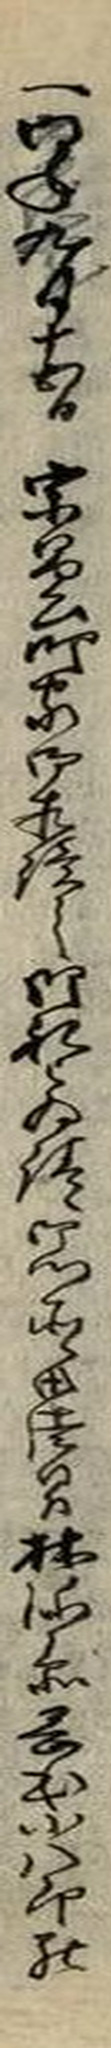一同年九月十五日宗昌公御家御相続之御礼被為請候御門所へ御徒目付林弥兵衛岡本小八郎罷
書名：御門御櫓之部
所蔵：福井県文書館 Fukui Prefectural Archives
